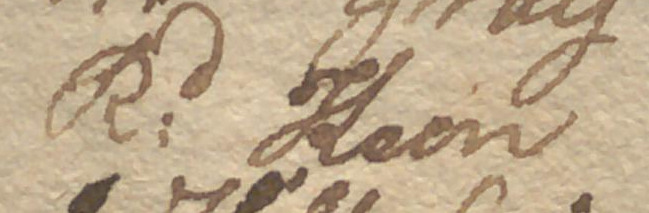R^d. Hoon
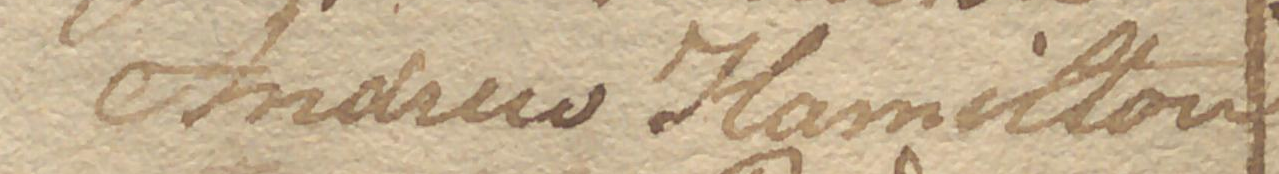Andrew Hamilton
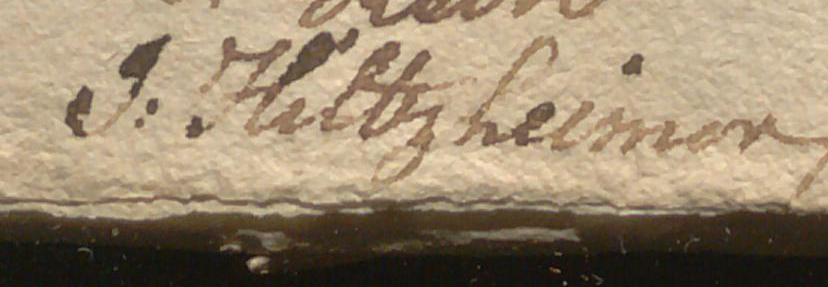J: Hiltzheimer
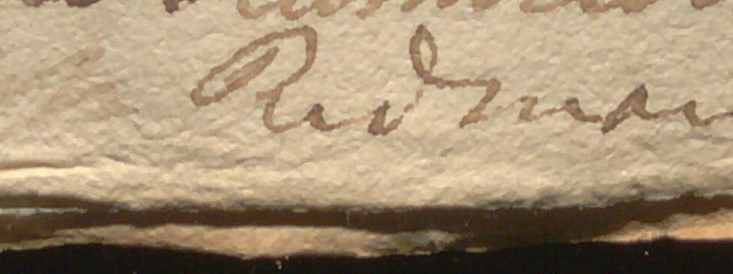Redman
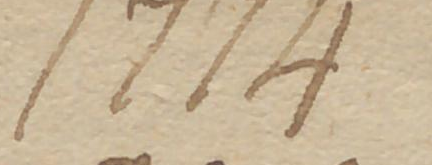1774
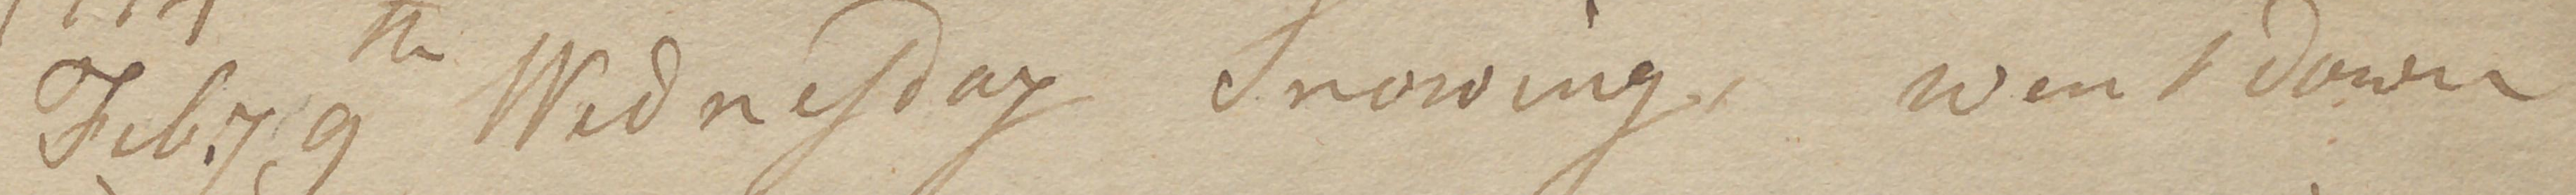Feb^y 9^th Wednesday Snowing, went down
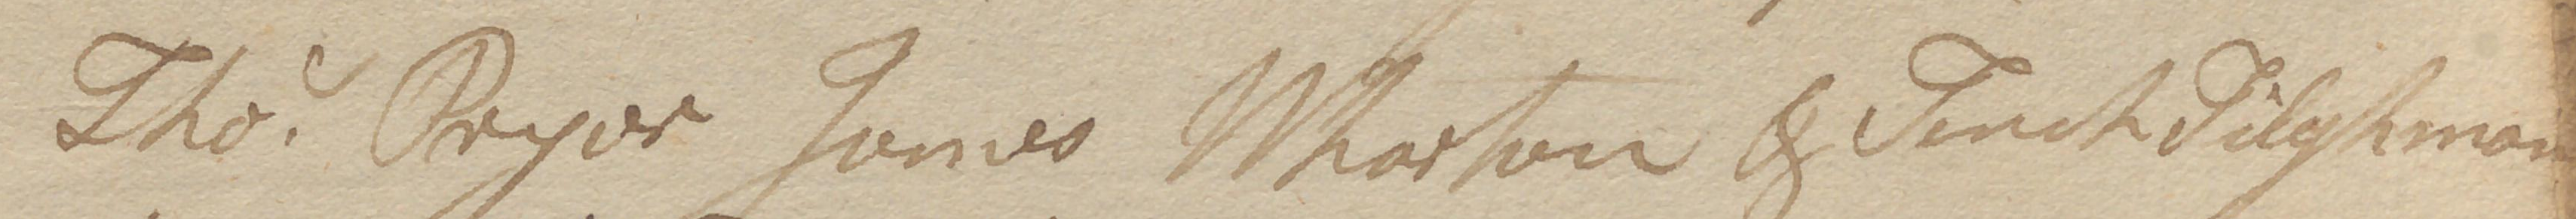Tho^s. Pryor James Wharton & Tench Tilghman
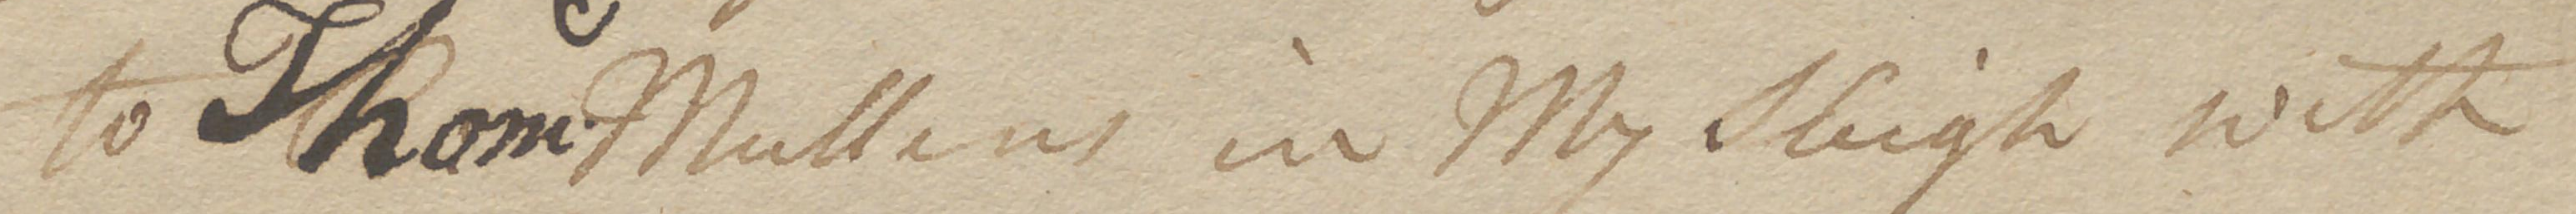to Thom^s Mullins in My Sleigh with
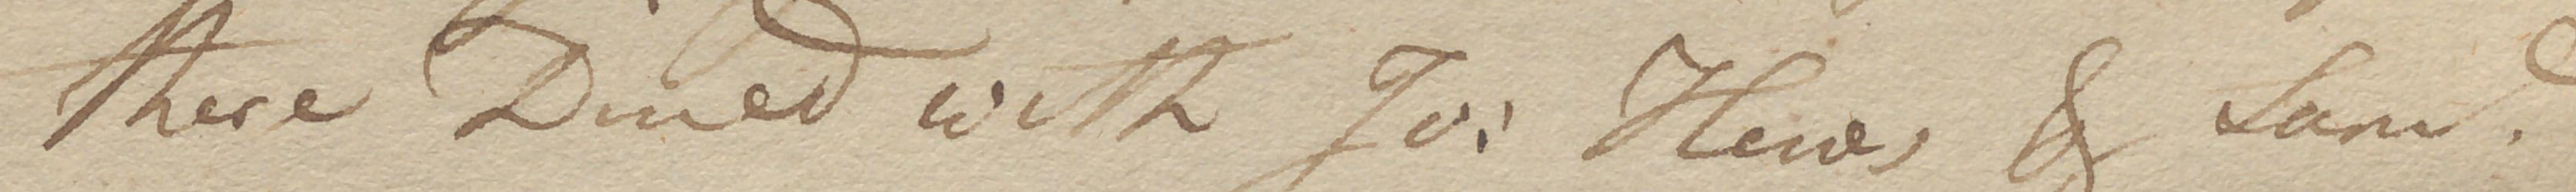there Dined with Jo. Hews & Sam^l.
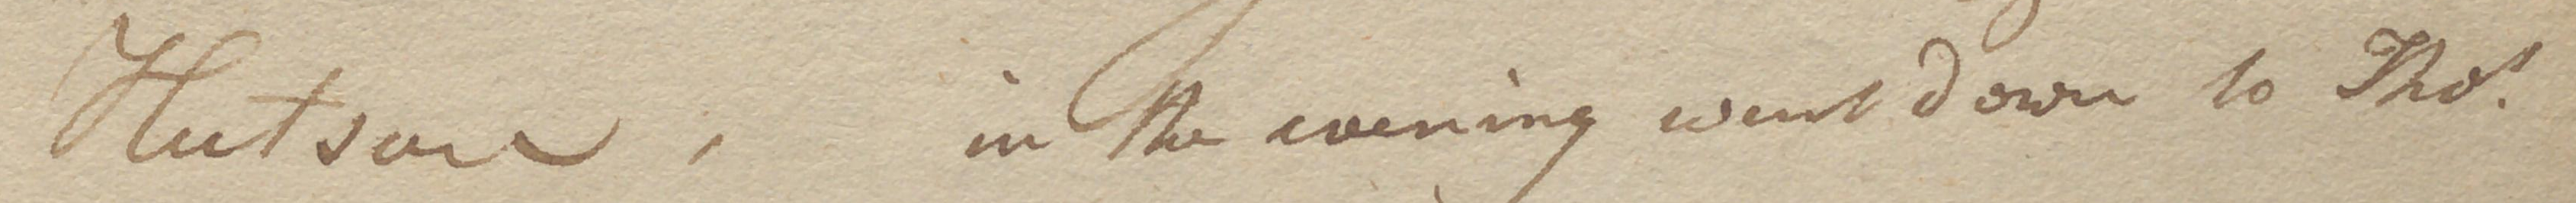Hutson, in the evening went down to Tho^s.
